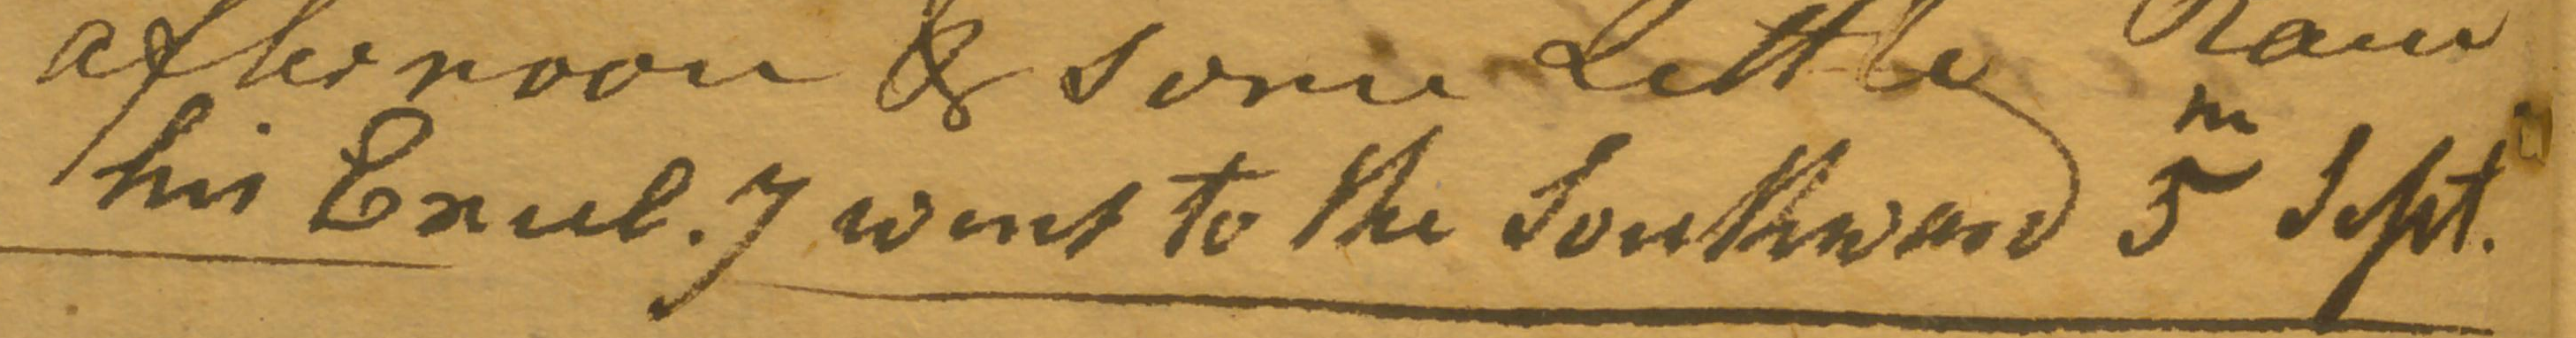his Excel^y. went to the Southward 5^th Sept.
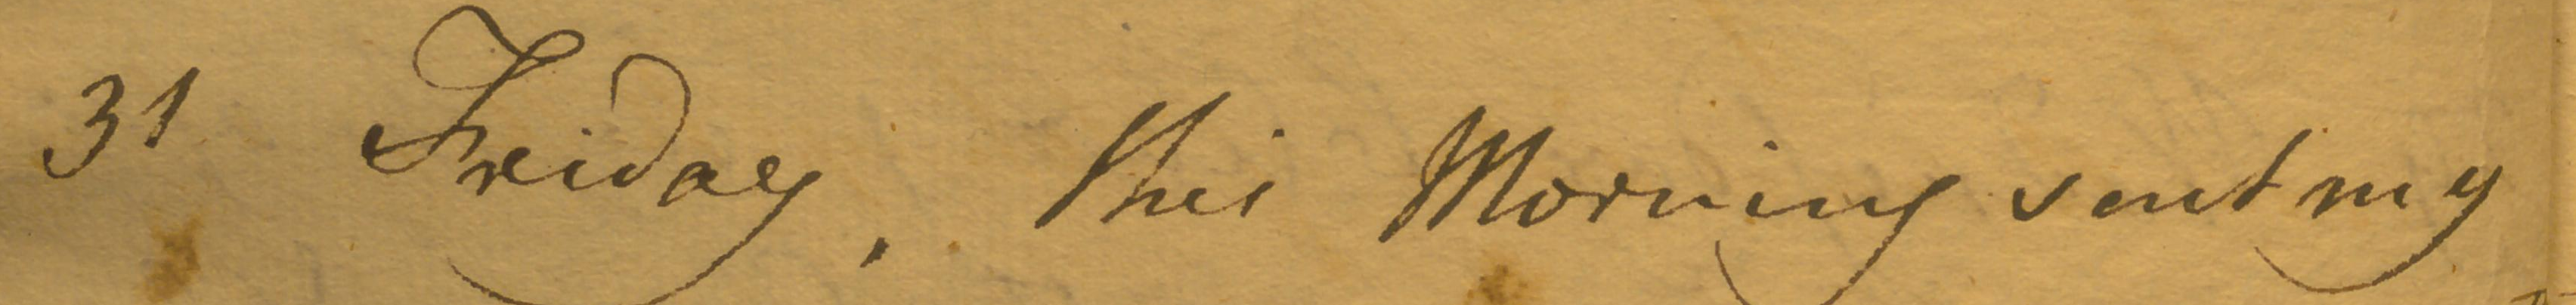31 Friday this Morning sent my
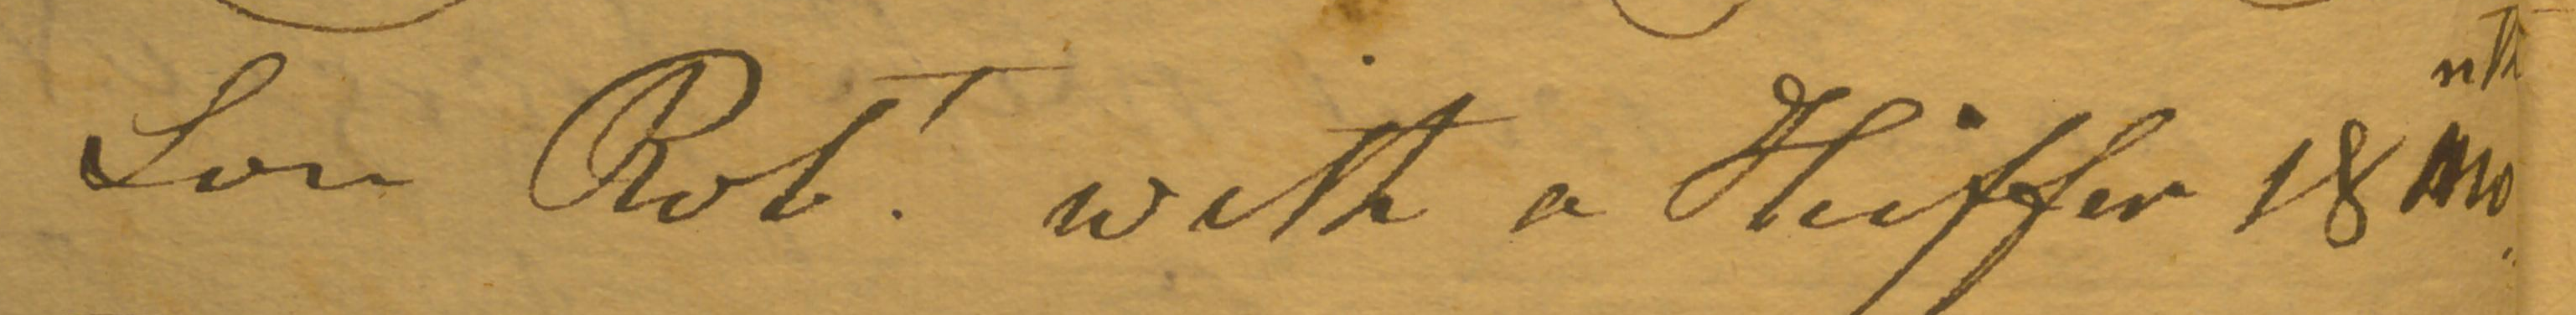son Rob^t. with a Heiffer 18 Mo
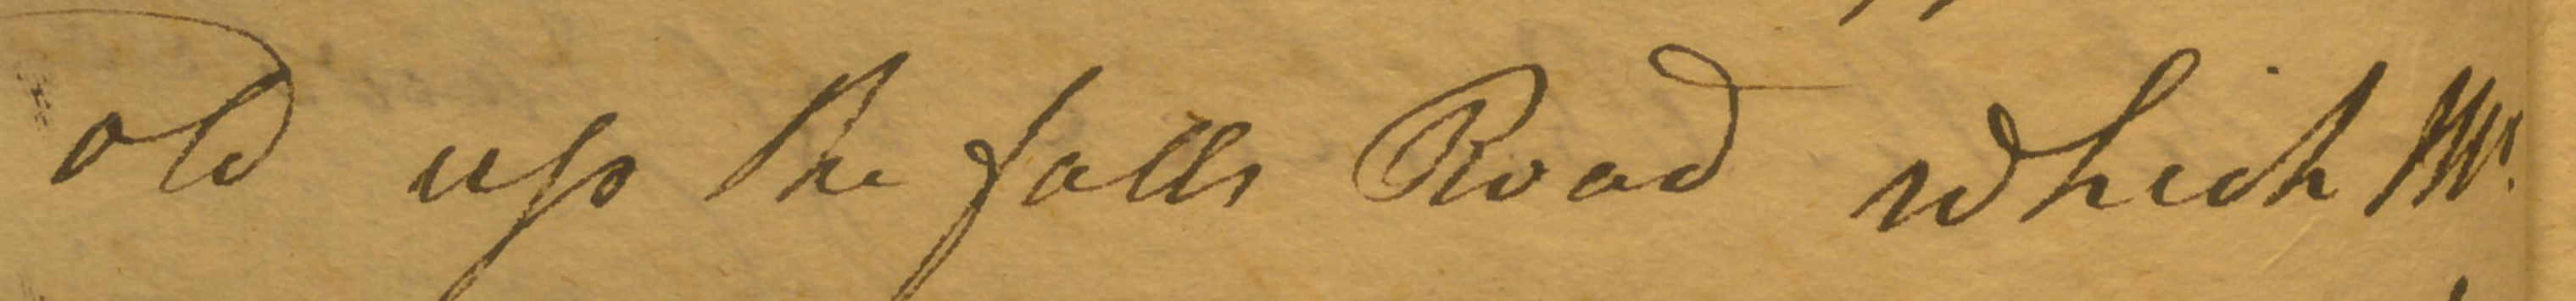old up the falls Road which M^r
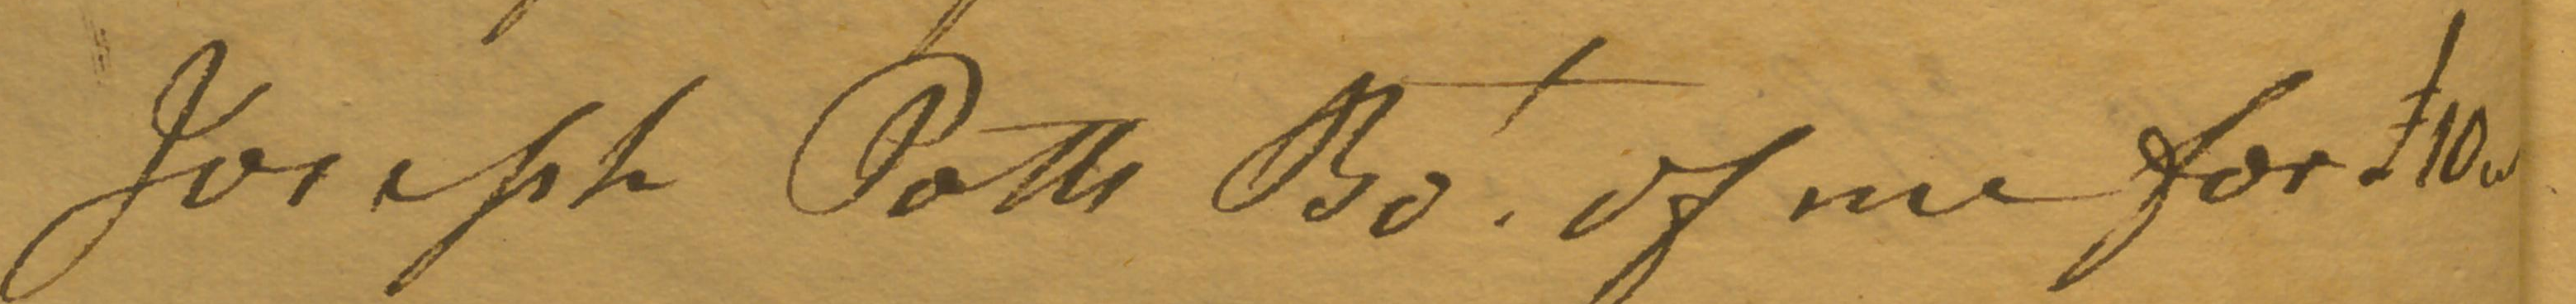Joseph Potts Bo^t. of ie for £10.
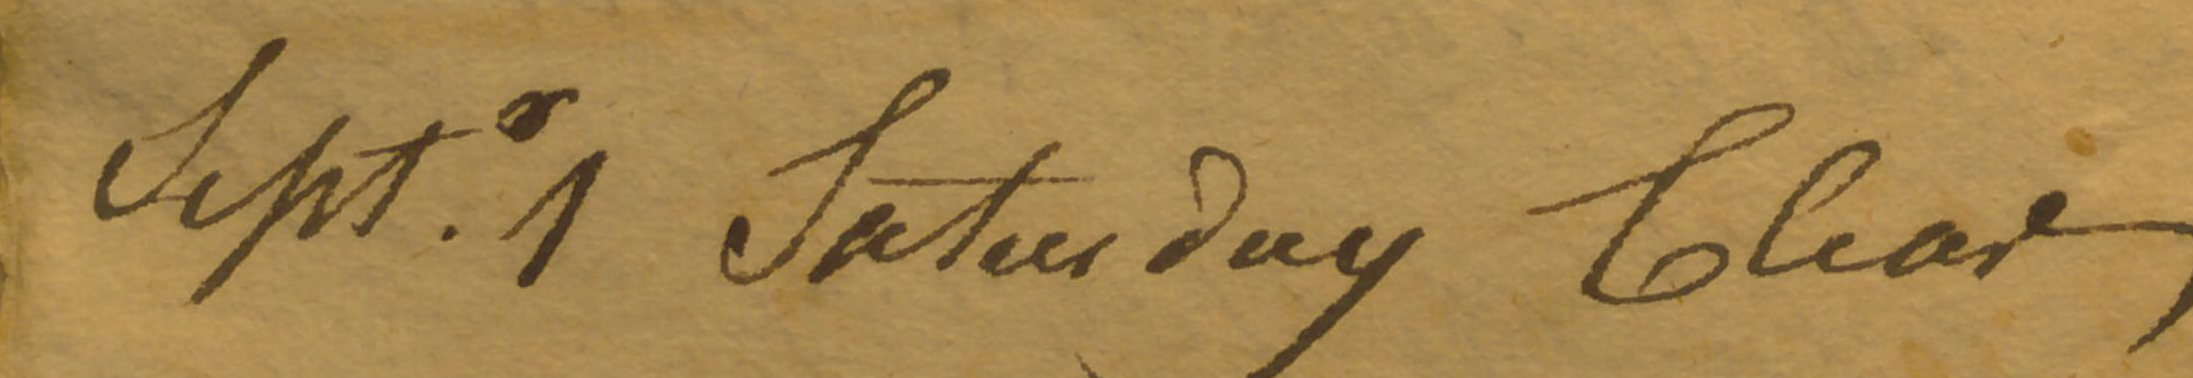Sept^r. 1 Saturday Clear
